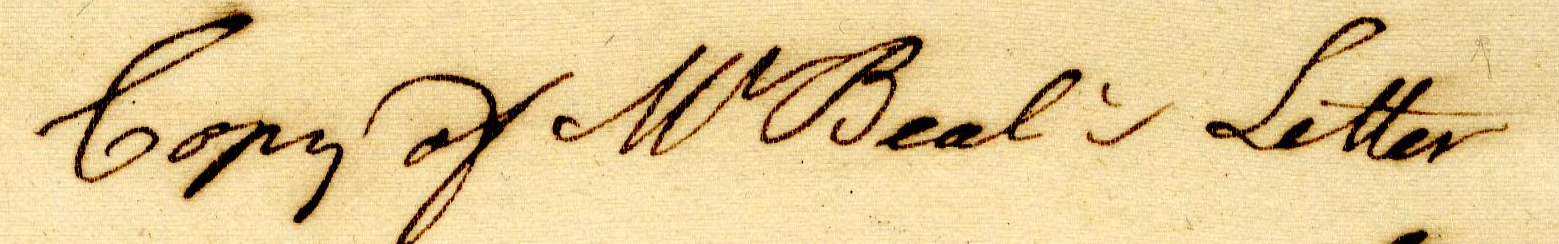Copy of M^r Beal's Letter
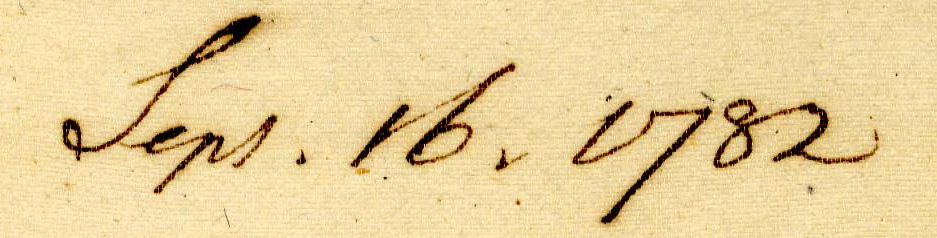Sept. 16. 1782
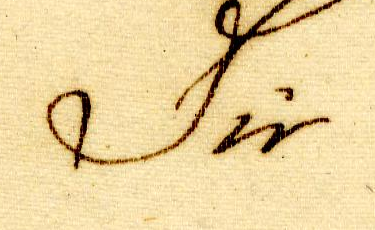Sir
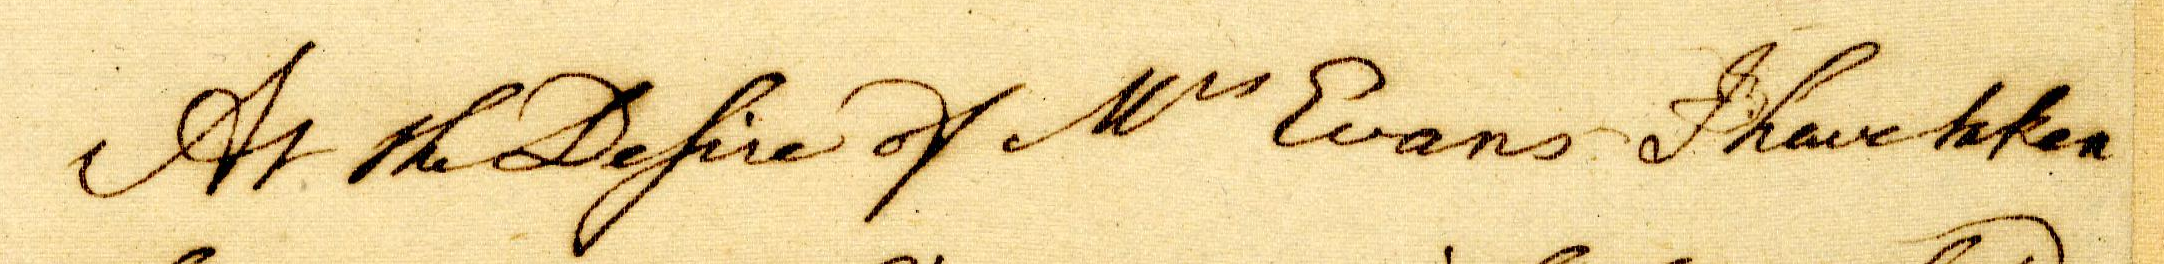At the Desire of M^rs Evans I have taken
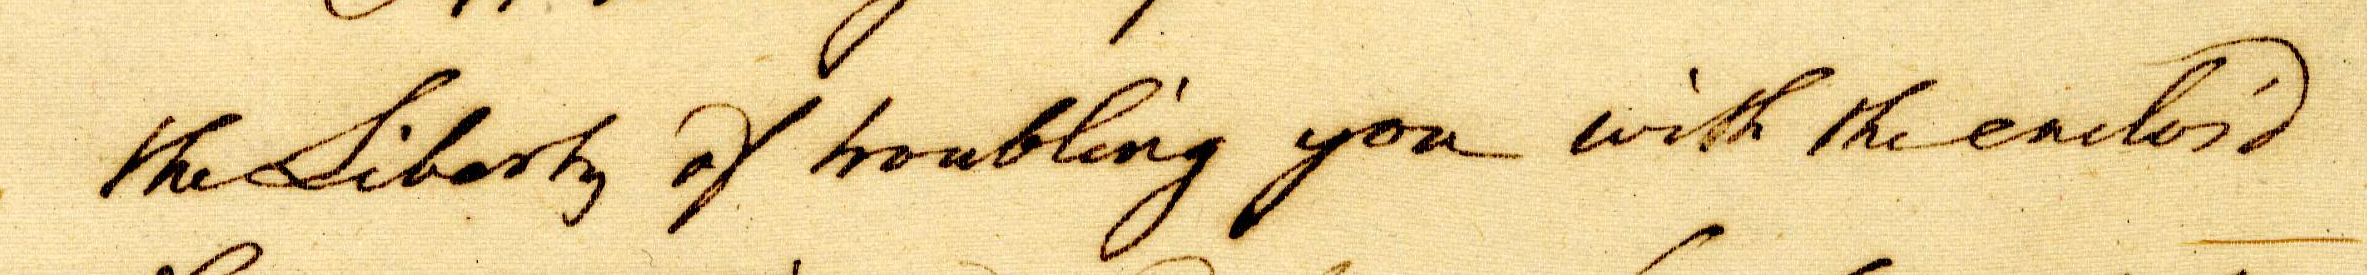the Liberty of troubling you with the enclos'd
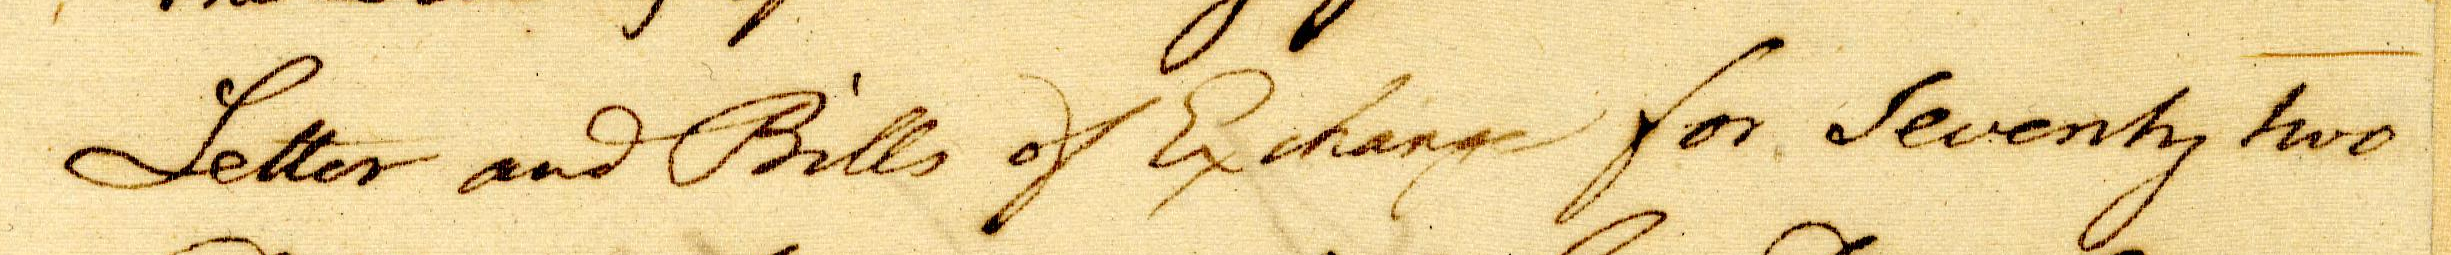Letter and Bills of Exchange for Seventy Two
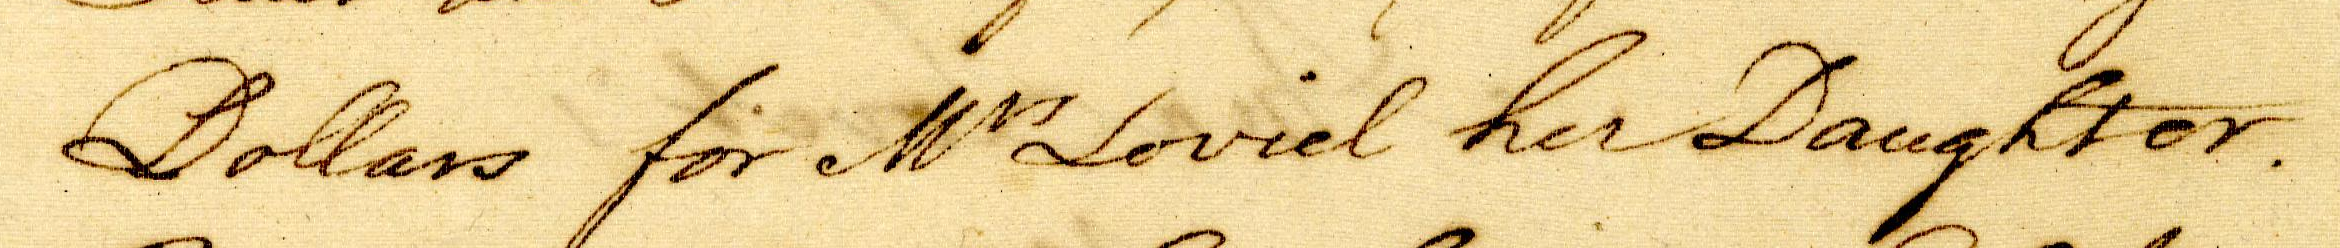Dollars for M^rs Leviel her Daughter.
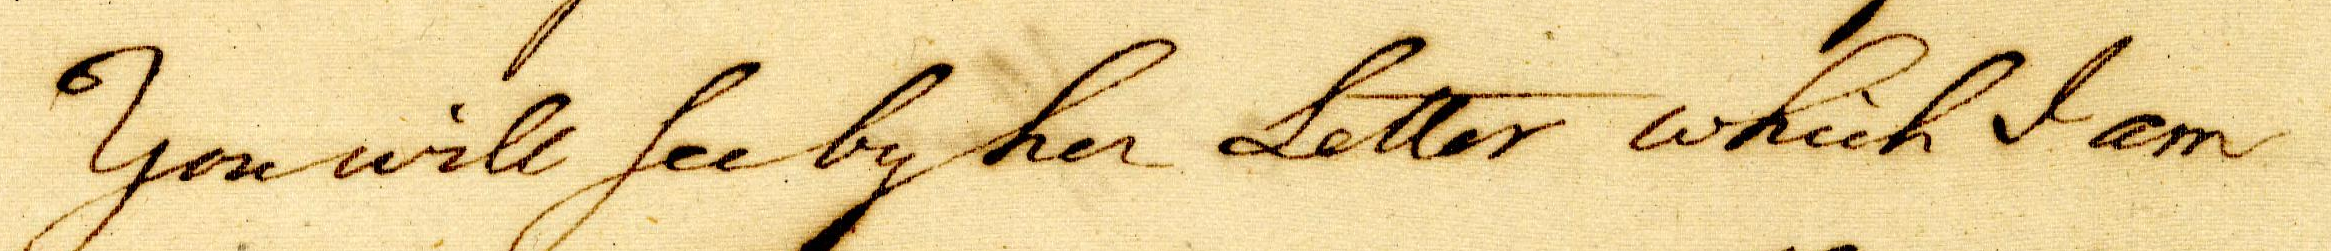You will see by her Letter which I am
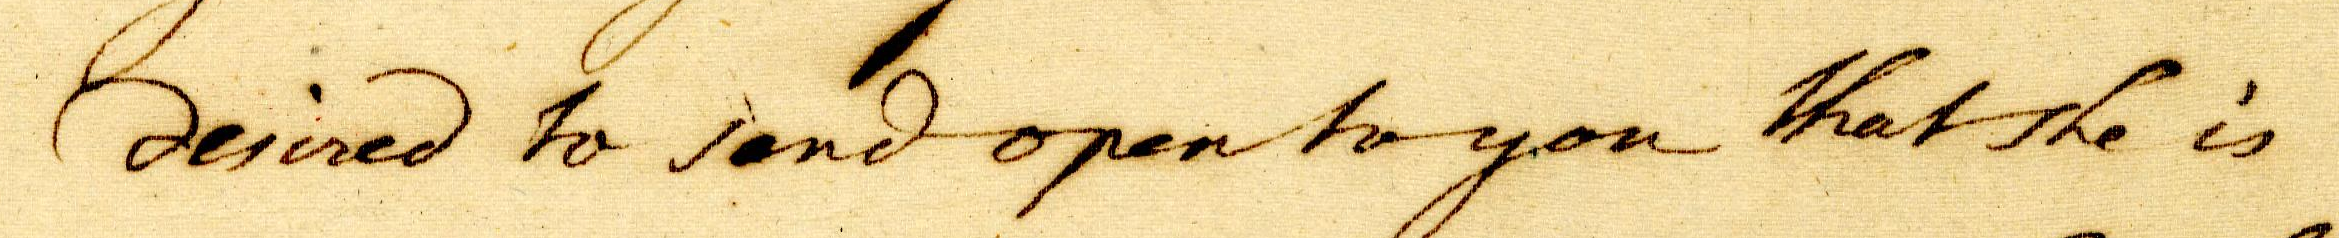desired to send open to you that she is
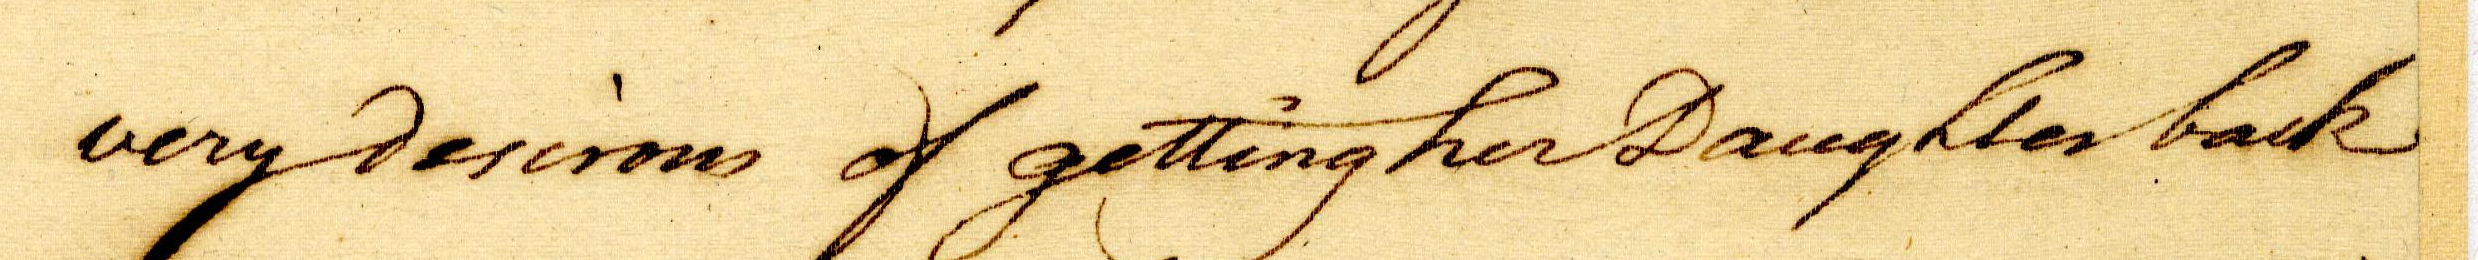very desirous of getting her Daughter back
